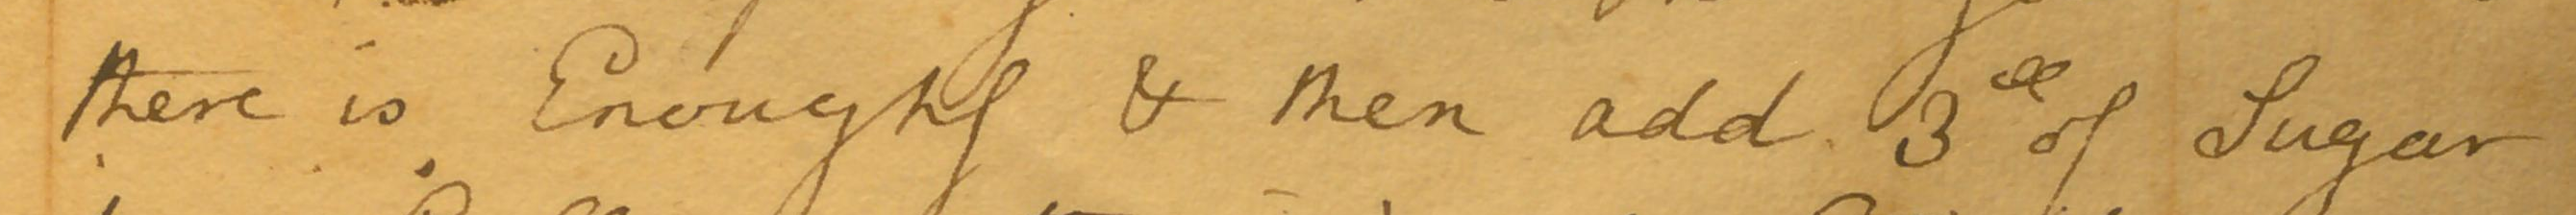there is Enough & then add 3 ^lb of Sugar
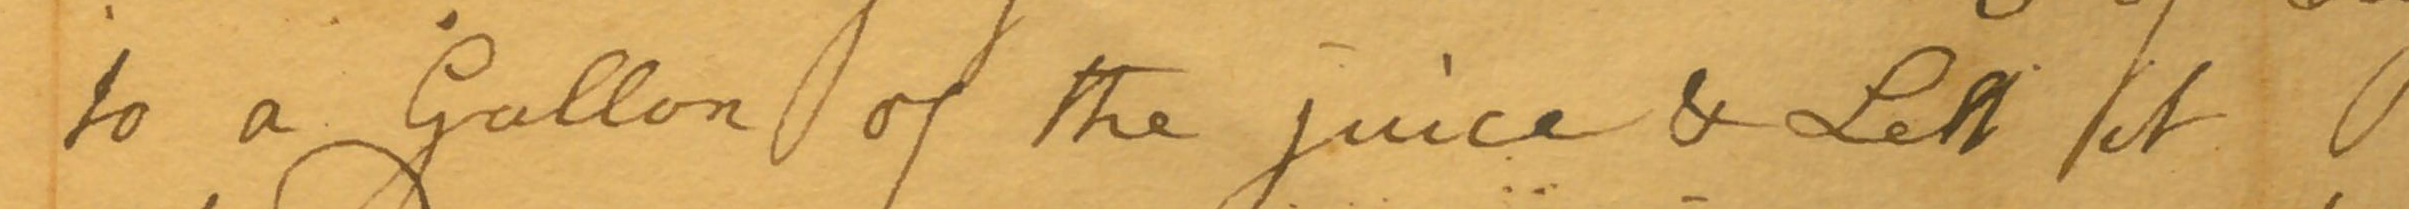to a Gallon of the juice & it
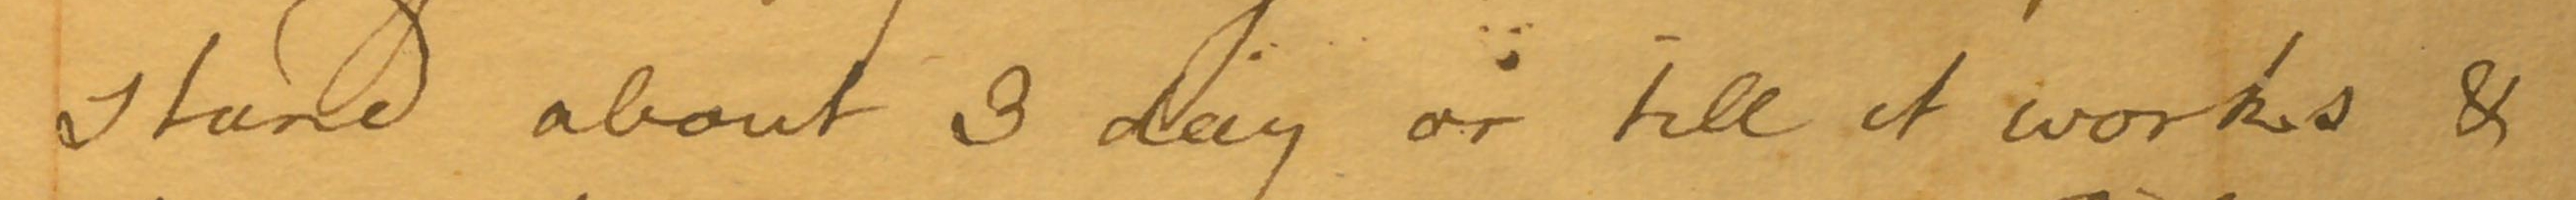stand about 3 day or till it works &
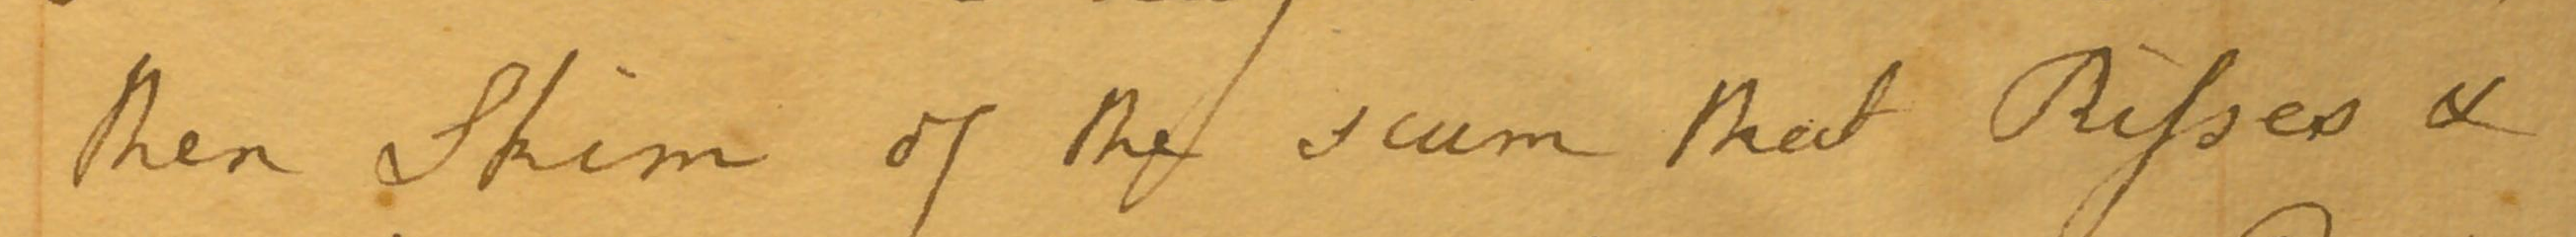then Skim of the scum that Risses &
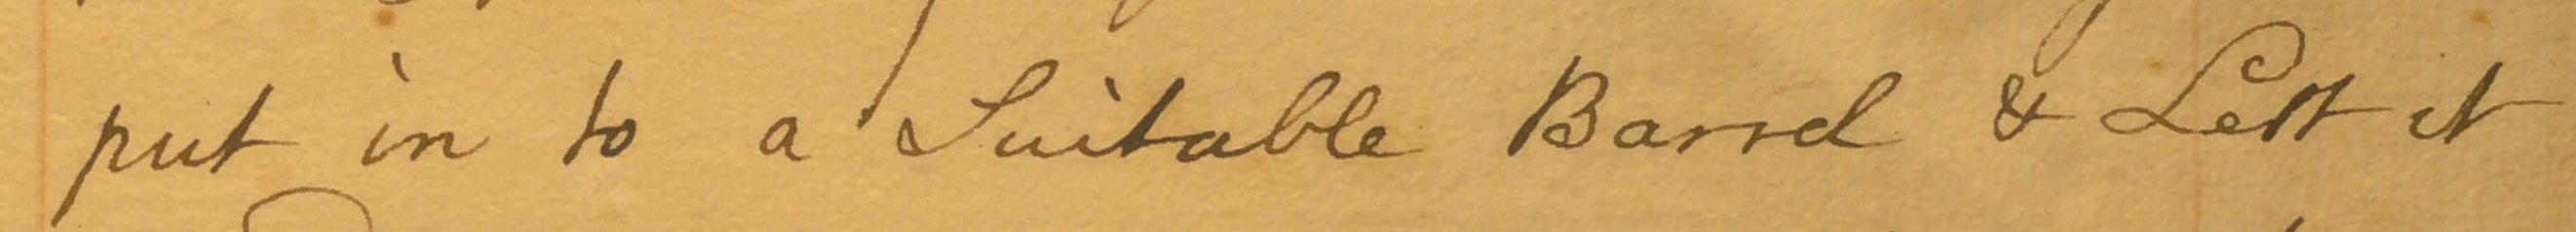put in to a suitable Barrel & Lett it
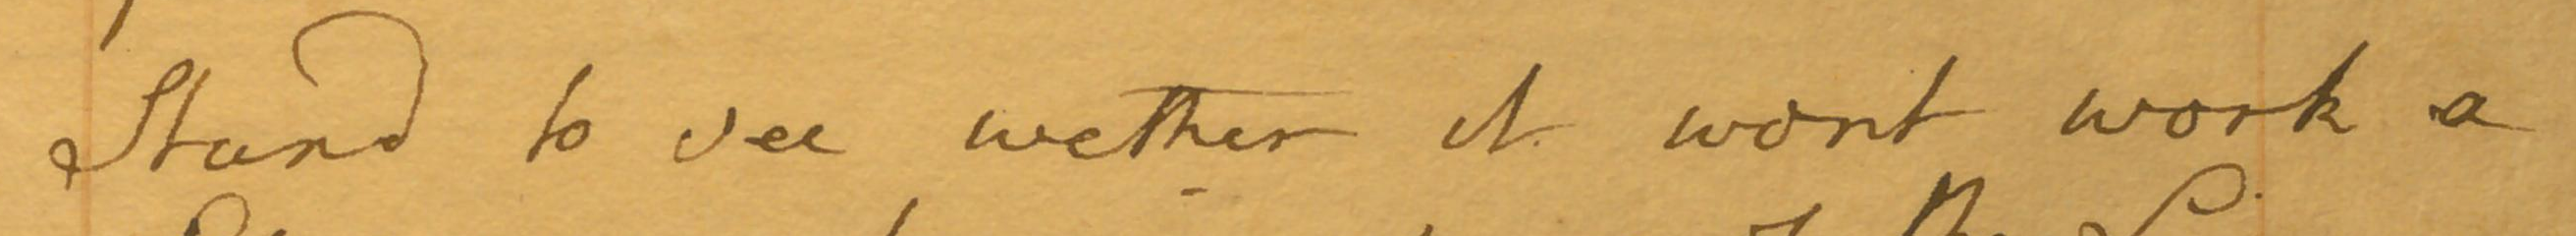Stand to see wether it wont work a
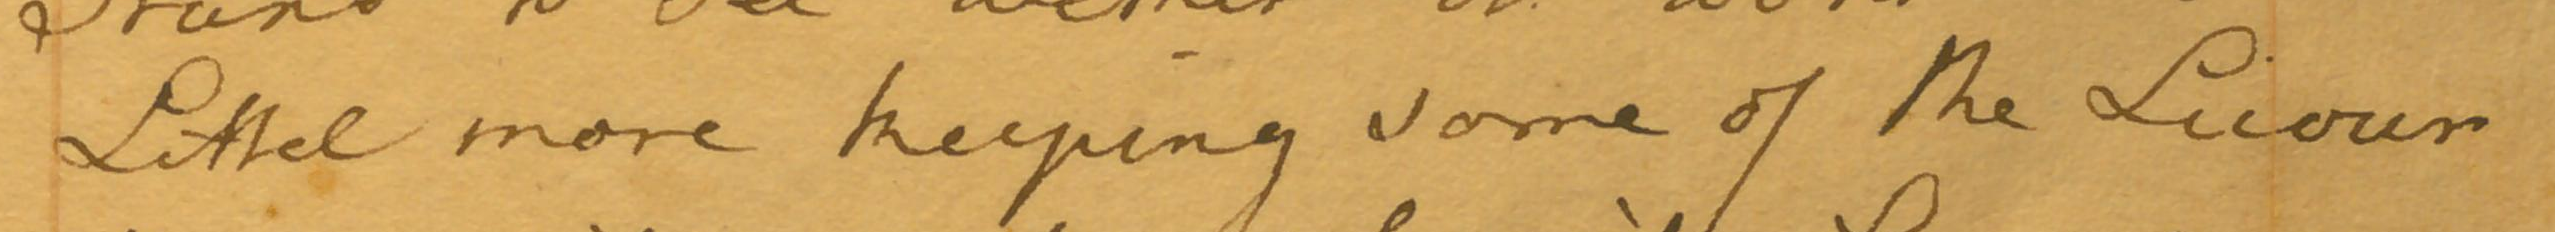Littel more keeping some of the Licour
